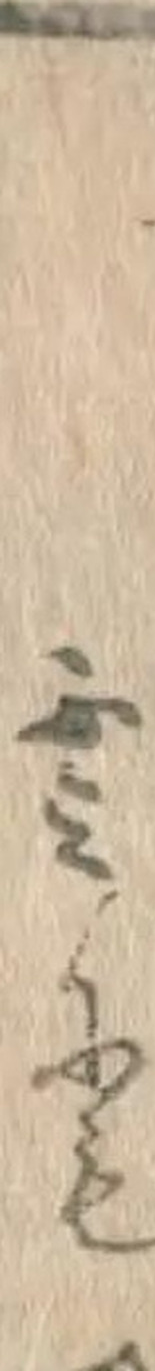ふみにも
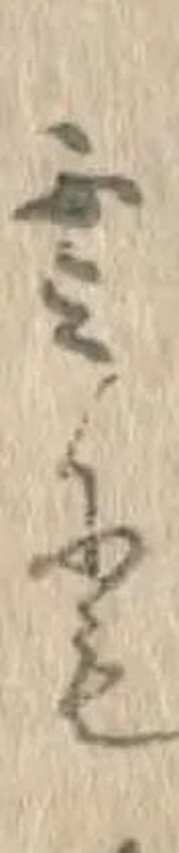ふみにも
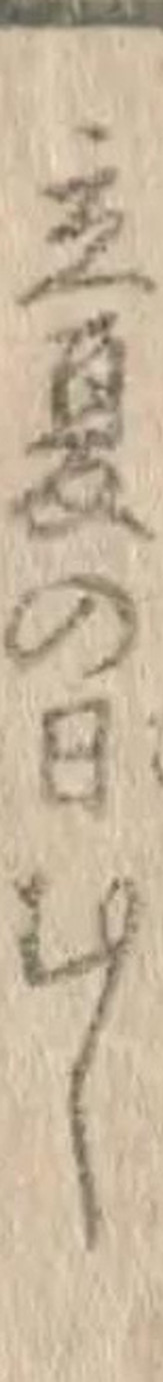立夏の日むし
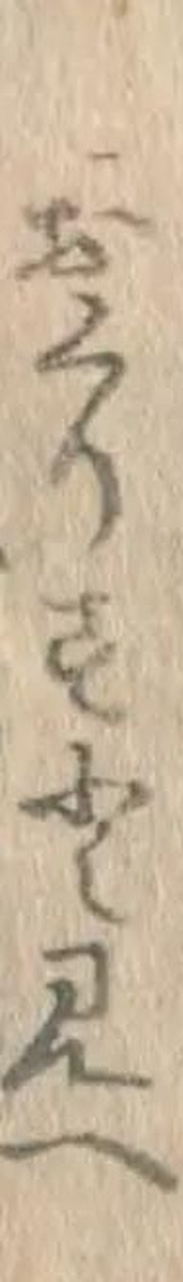おくりすと見へ
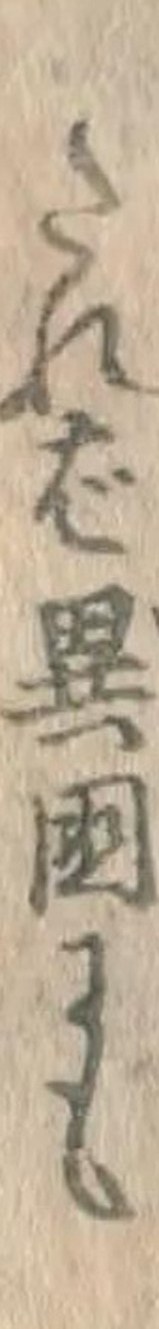たれば異国にも
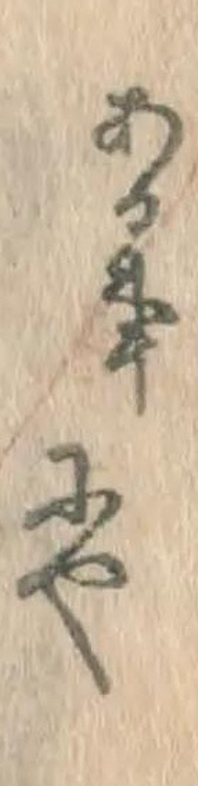ある事にや

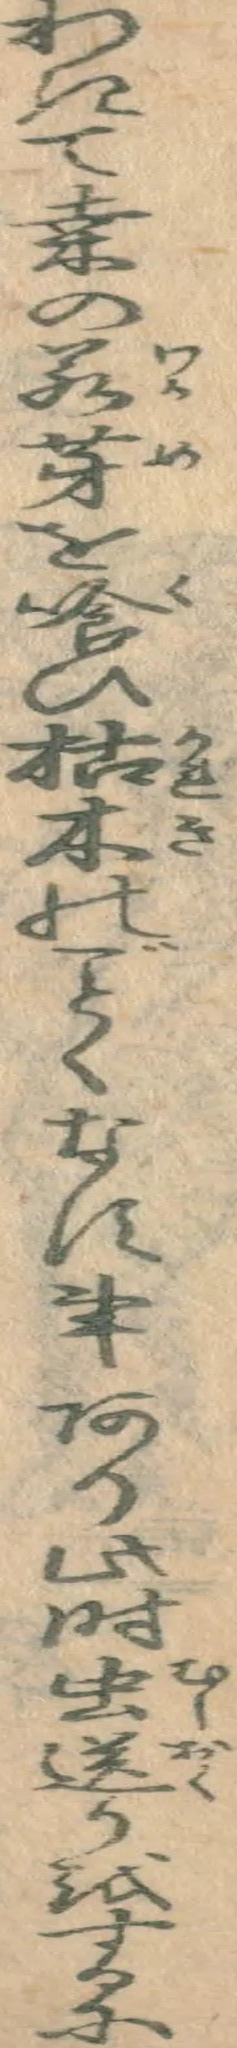わきて桑の若芽を喰ひ枯木のごとくなす事あり此時虫送りをするに
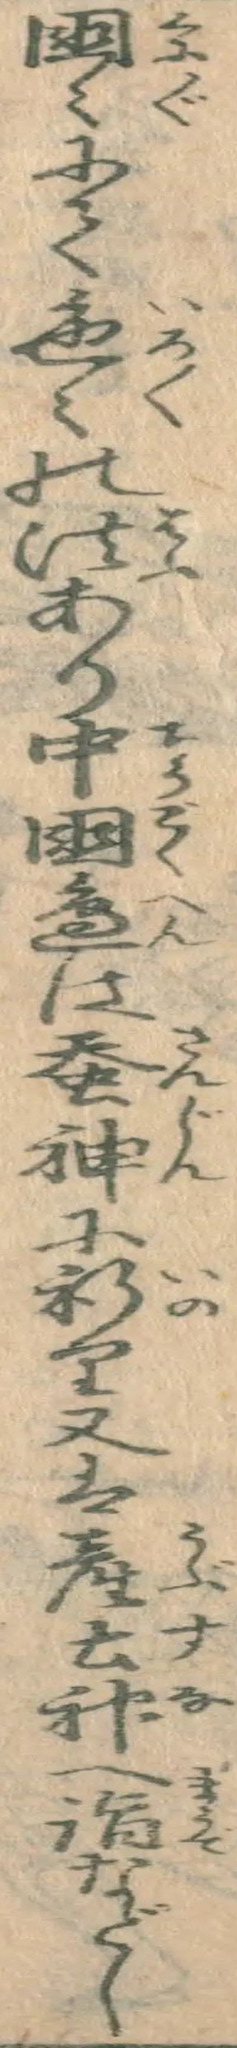国々にて色々の法あり中国辺は蚕神に祈り又は産土神へ詣などし
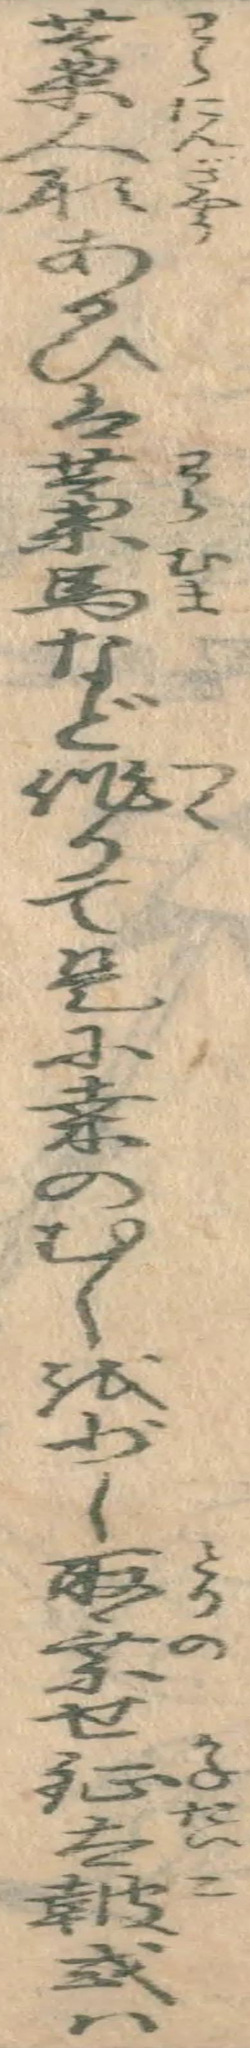藁人形あるひは藁馬など作りて是に桑のむしを少し取乗せ鉦太鼓或は
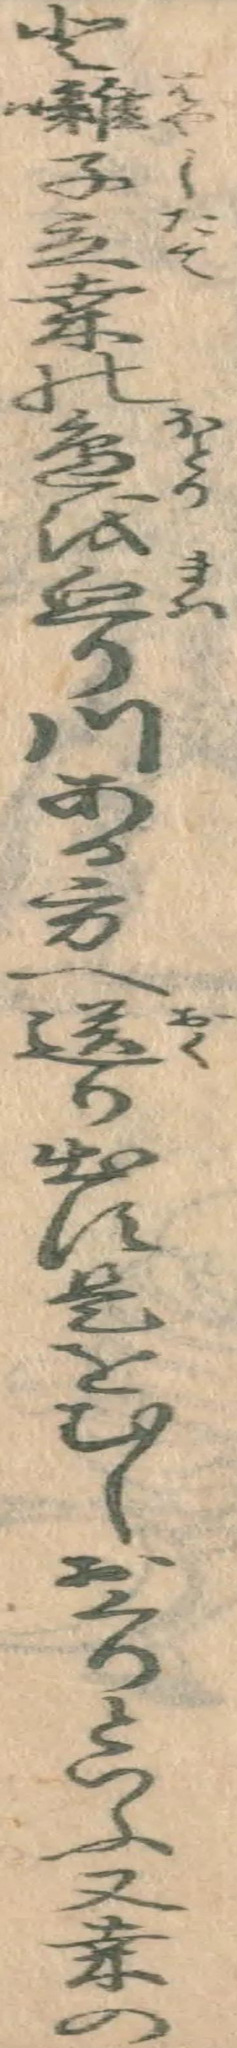と囃子立桑の辺を廻り川ある方へ送り出す是をむしおくりといふ又桑の
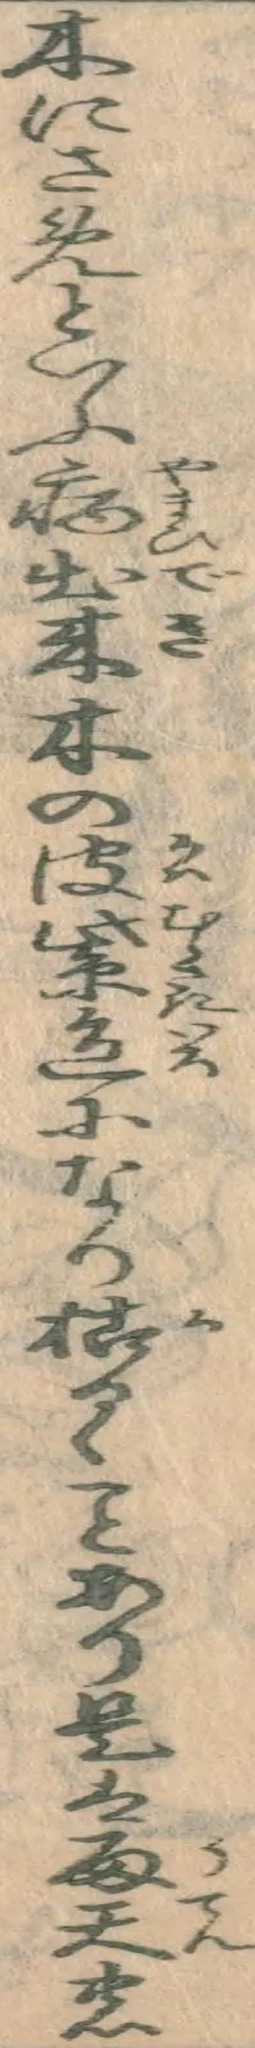木にさめといふ病出来木の皮紫色になり枯るゝことあり是は雨天の
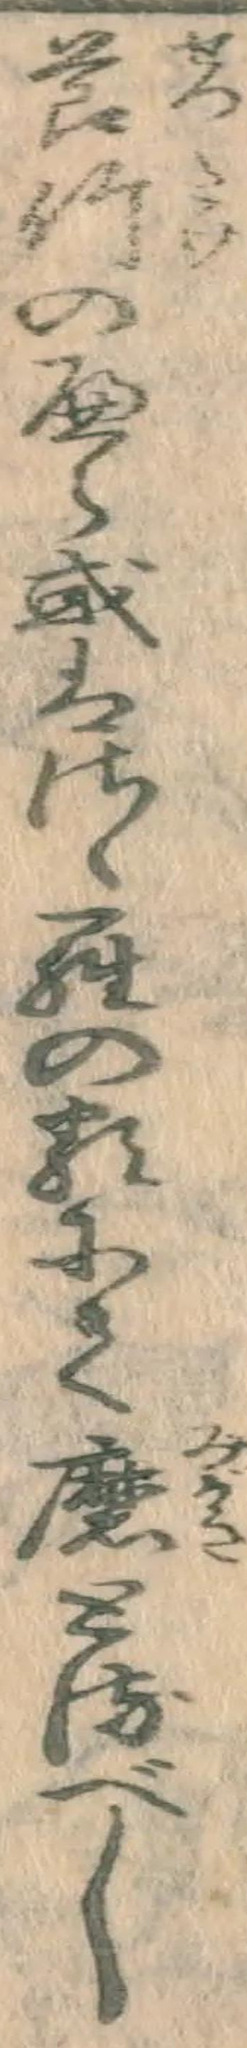節竹のへら或はさゝらの類にて磨とるべし
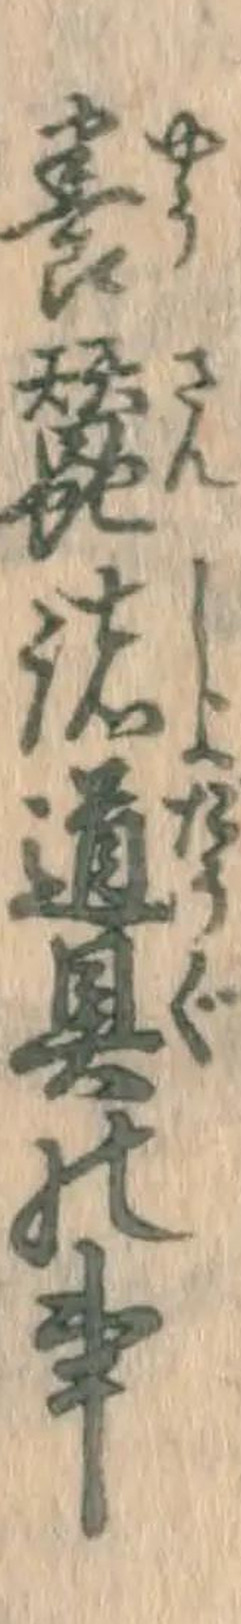養蚕諸道具の事
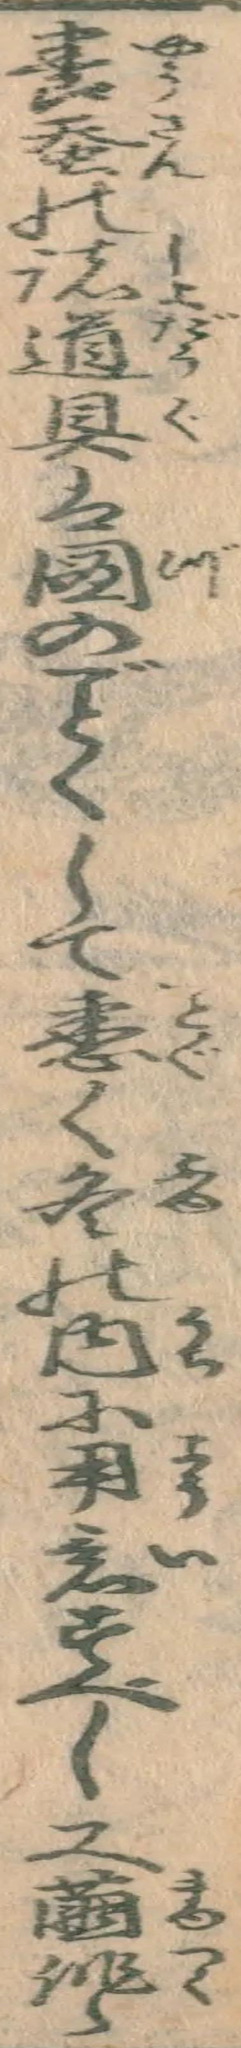養蚕の諸道具は図のごとくして悉く冬の内に用意すべし又繭作ら
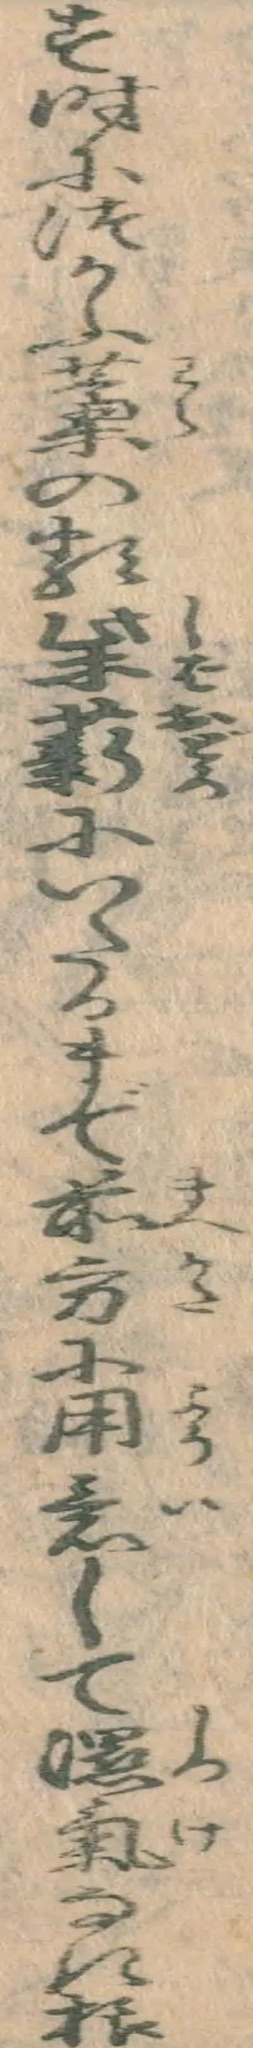す時につかふ藁の類柴薪にいたるまで前方に用意して湿気なき様
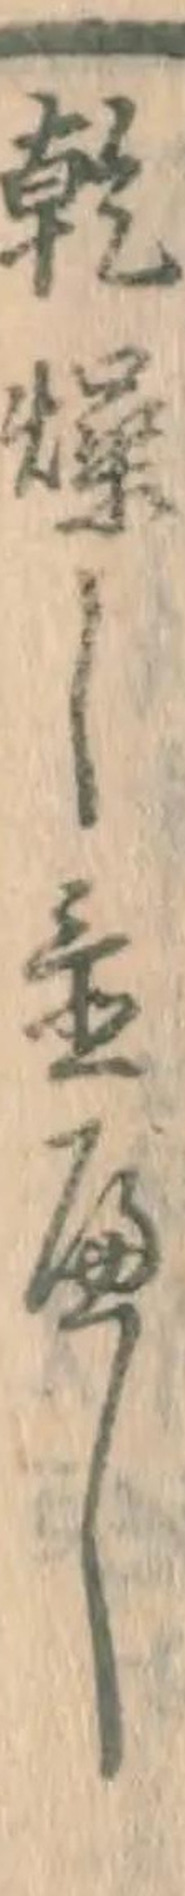乾燥し置べし
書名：養蚕秘録 3巻. [1]
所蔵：国立国会図書館 National Diet Library, JAPAN
